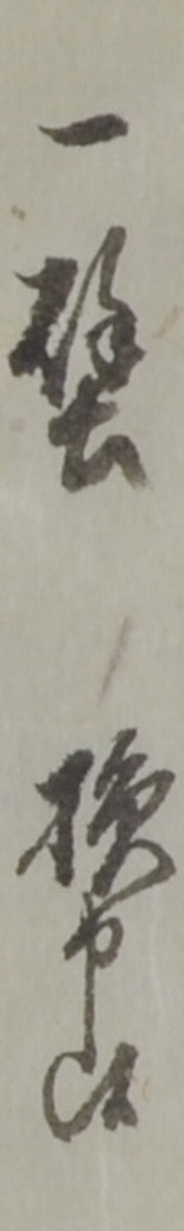一壁損申候
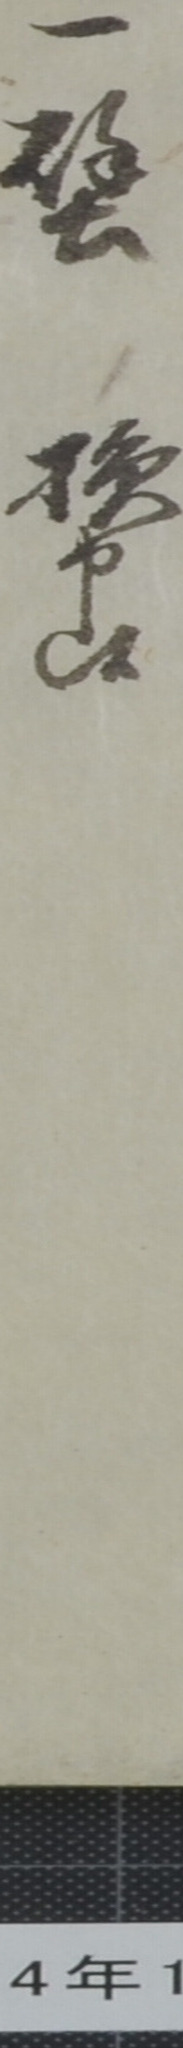一壁損申候
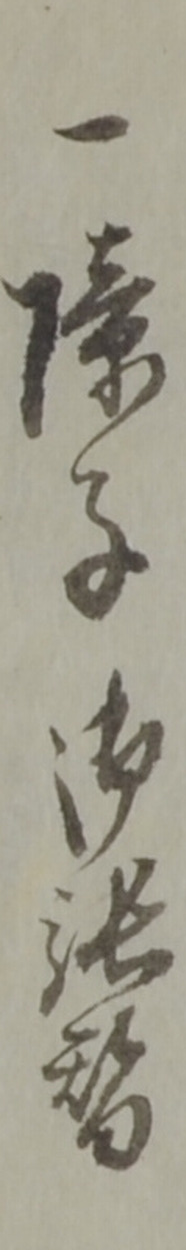一障子御張替
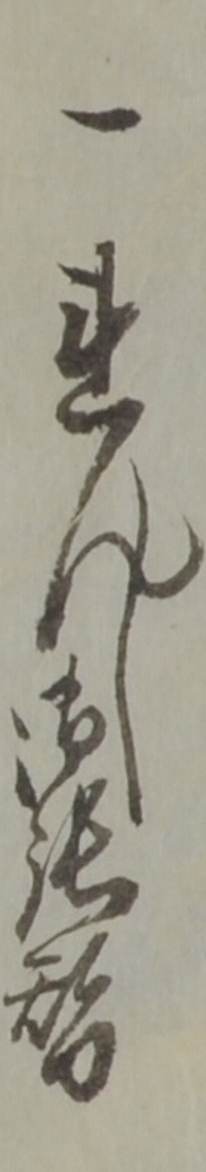一連ん御張替
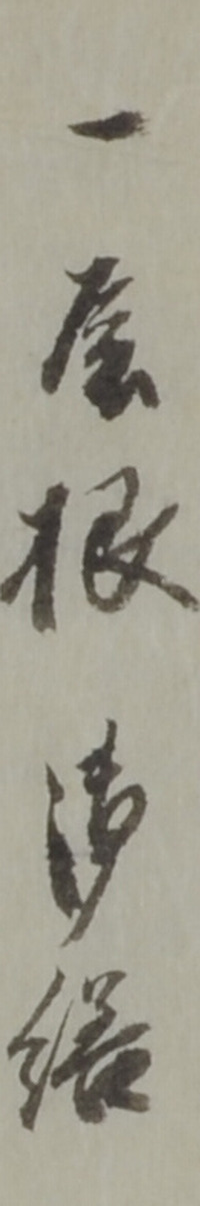一屋根御繕
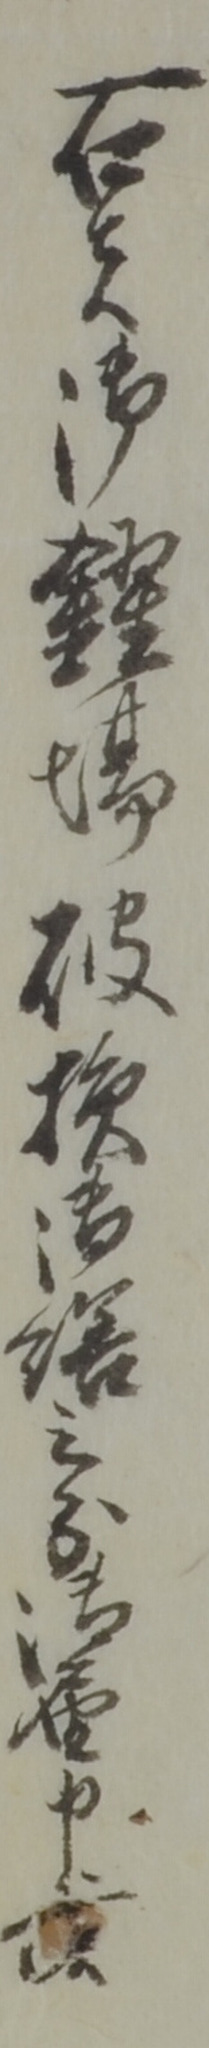右者御鐘場破損御繕之分御届申候
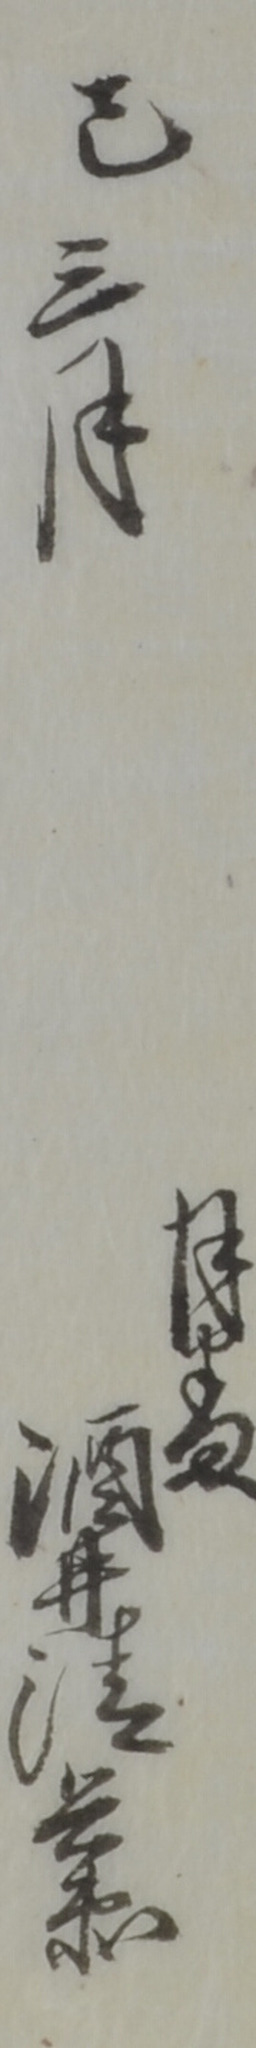巳三月酒井清兵衛
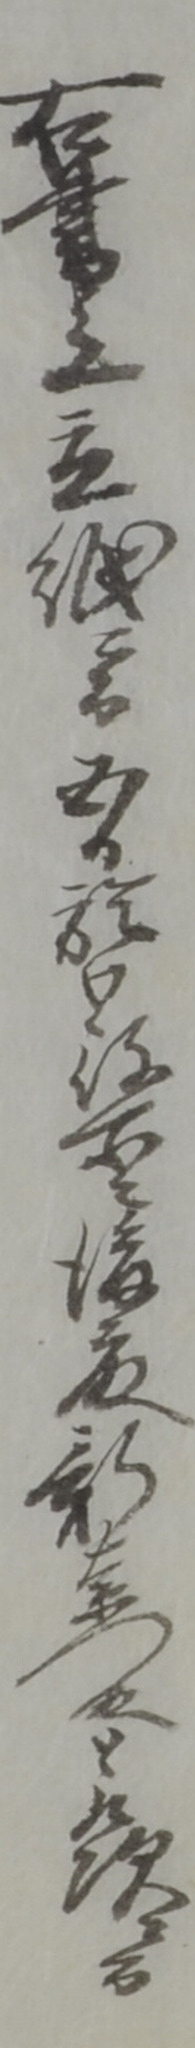右書上立紙ニ而五日於御役所ニ後藤新右衛門殿御取次ニ而
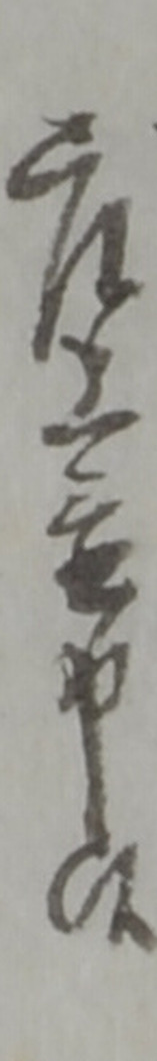差上置申候
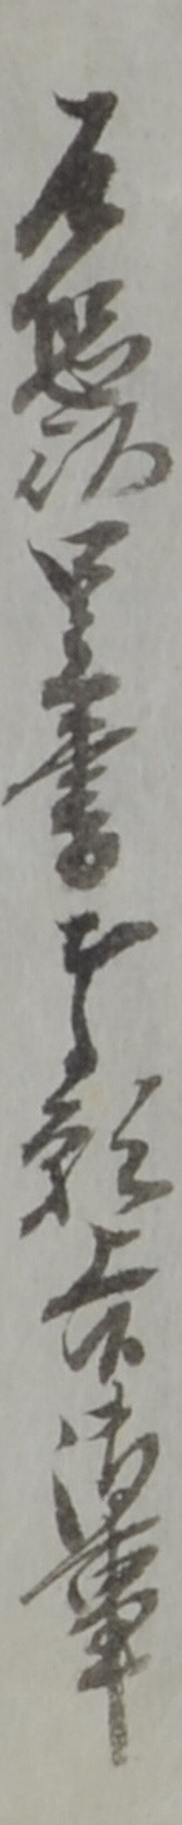乍恐以口上書奉願上候御事
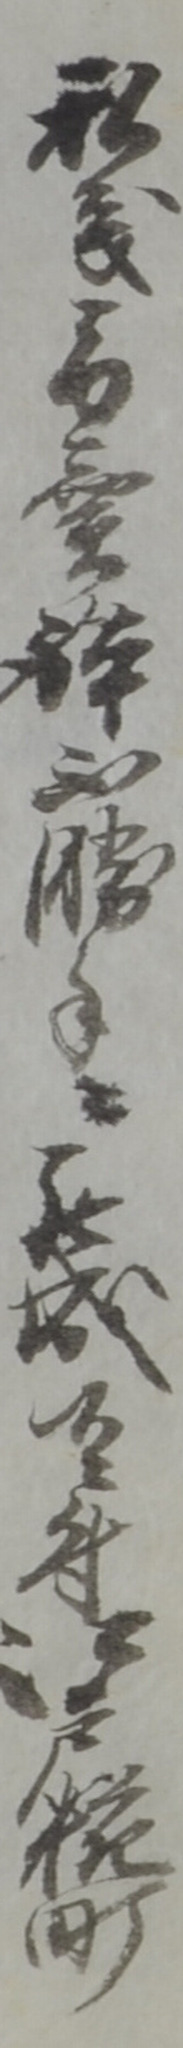私義商売体不勝手ニ罷成候ニ付江戸糀町
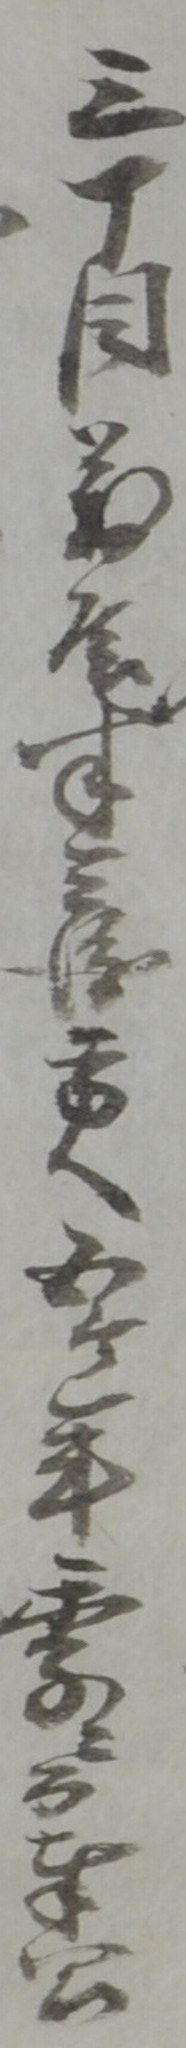三丁目萬屋半兵衛方へ五ヶ年季ニ而奉公
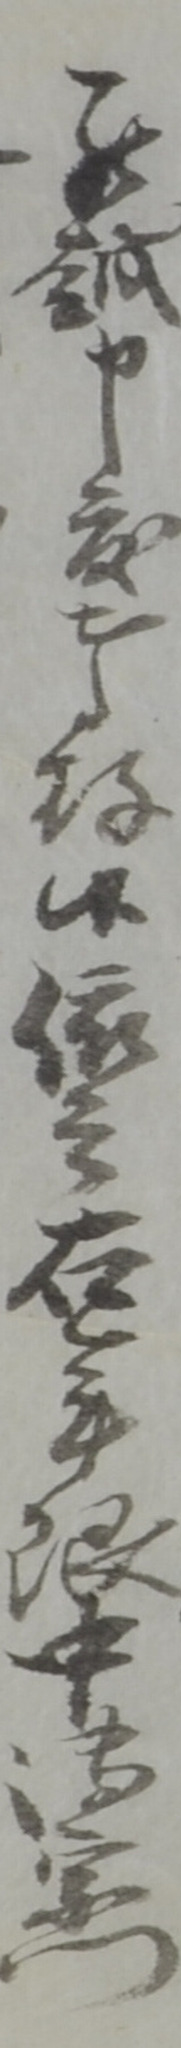罷越申度奉存候依之右年限中御宗門
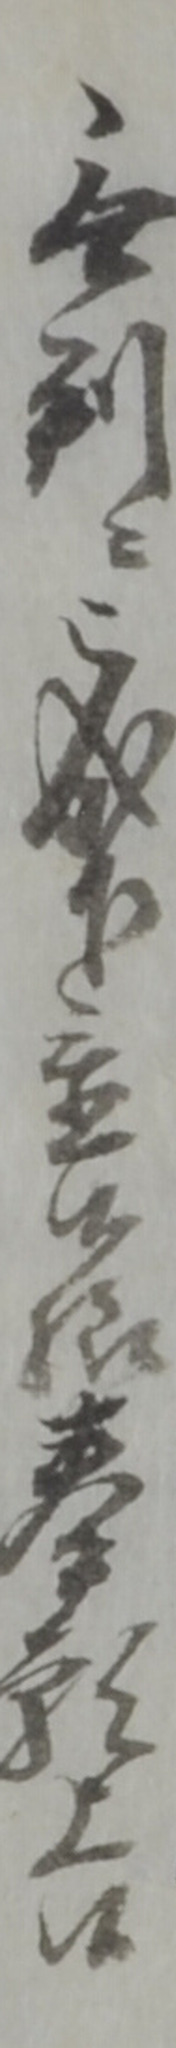無判ニ被成下置候様奉願上候
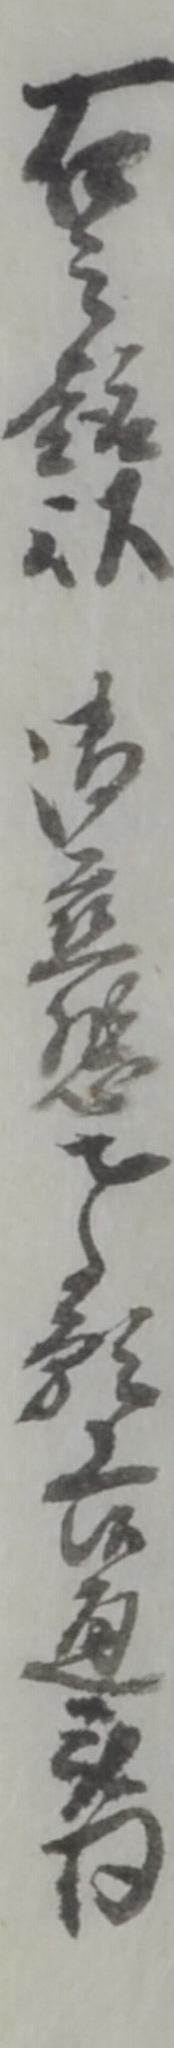右之趣以御慈悲奉願上候通被為仰付

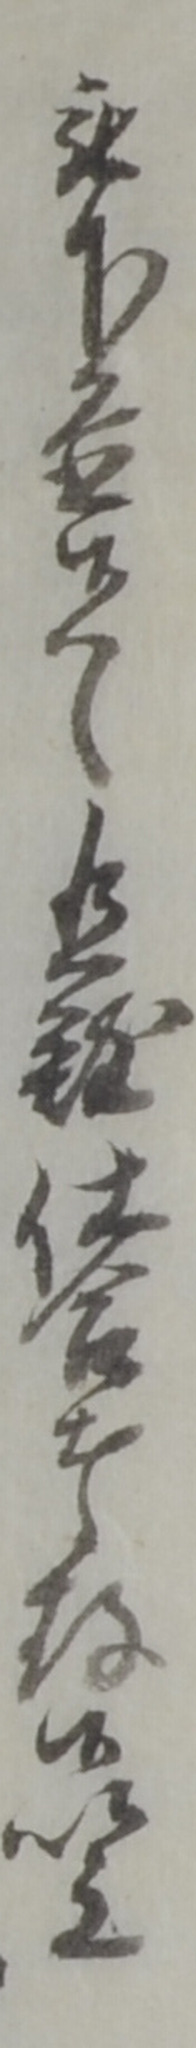被下置候ハヽ難有仕合奉存候以上
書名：諸願書控簿
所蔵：伊那市立高遠町図書館・合同会社AMANE
